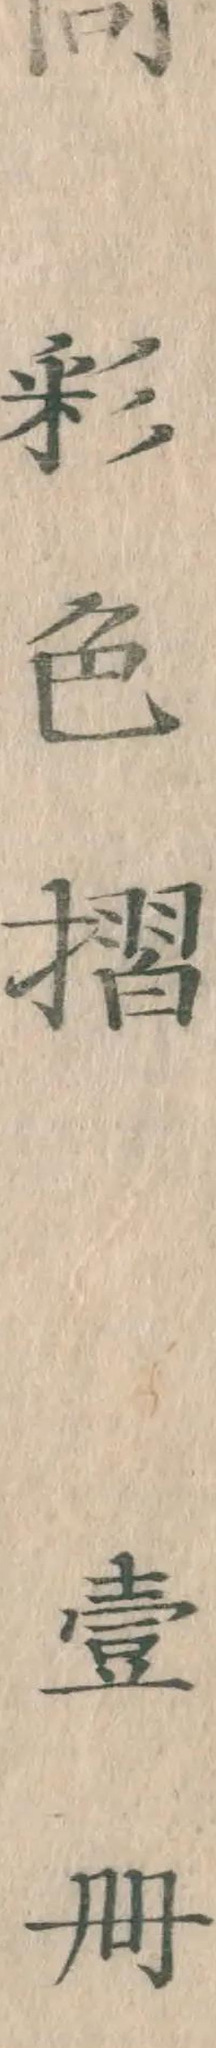同彩色摺壱冊
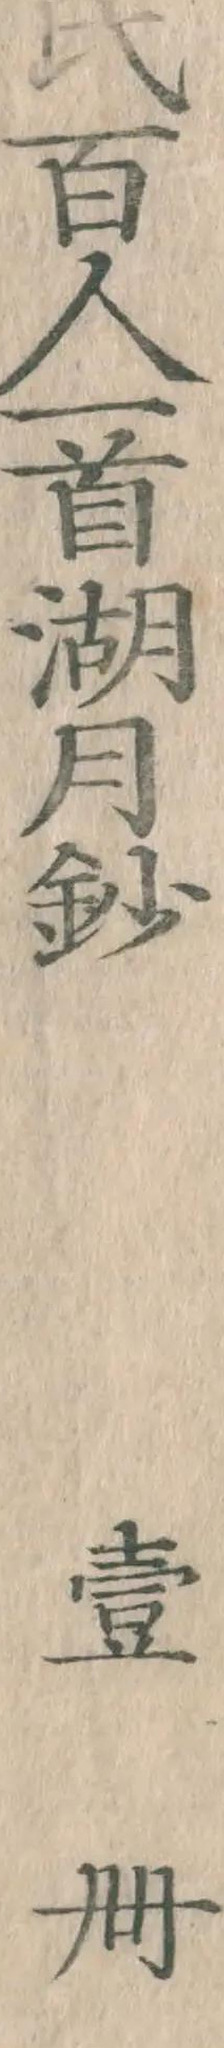源氏百人一首湖月鈔壱冊
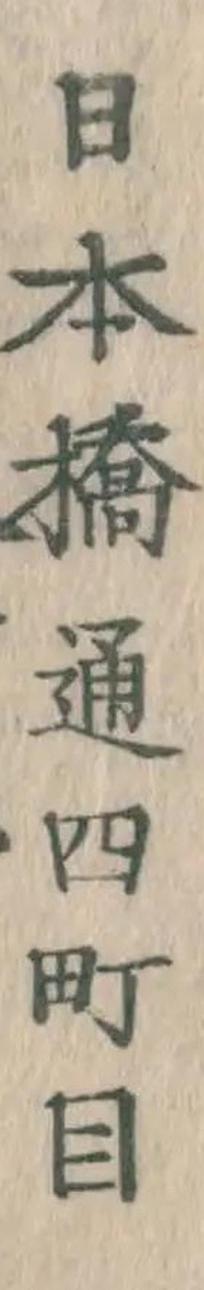日本橋通四丁目
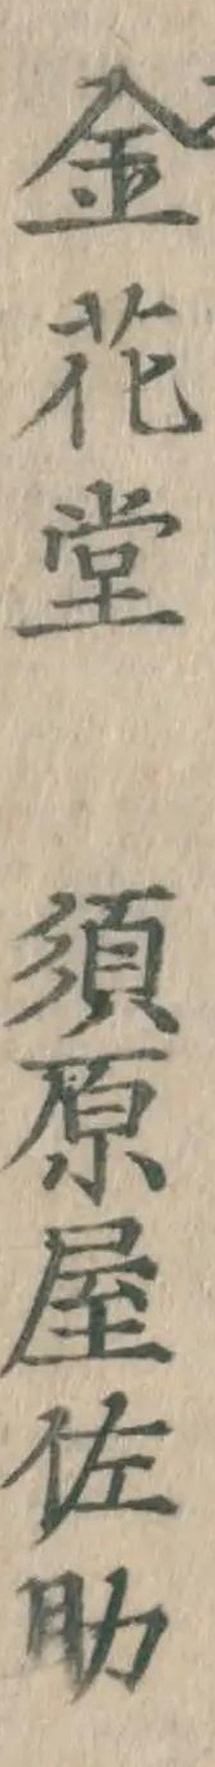金花堂須原屋佐助
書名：山繭養法秘傳抄
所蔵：国立国会図書館 National Diet Library, JAPAN
